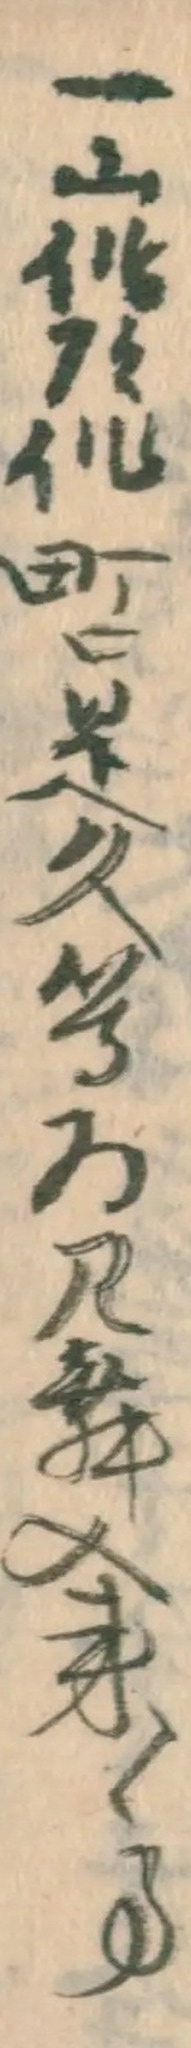一山脇道作町口是久等為見舞入来候事
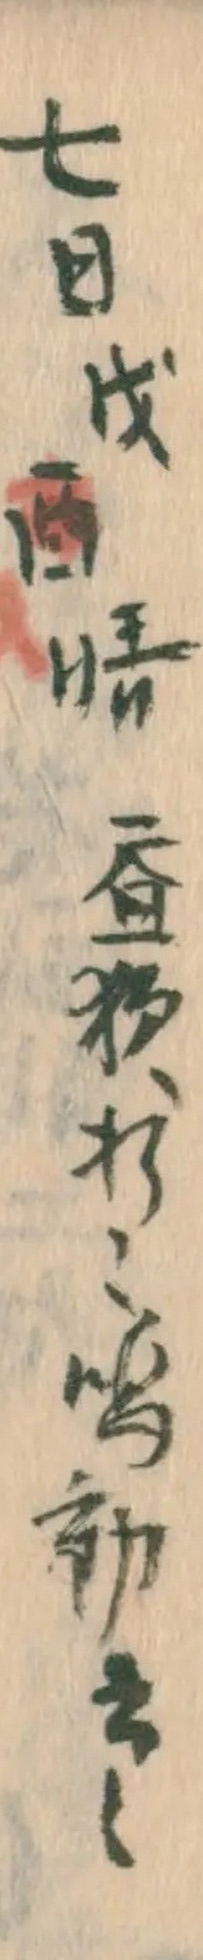七日戊「酉」戌晴昼夜折々鳴動有之
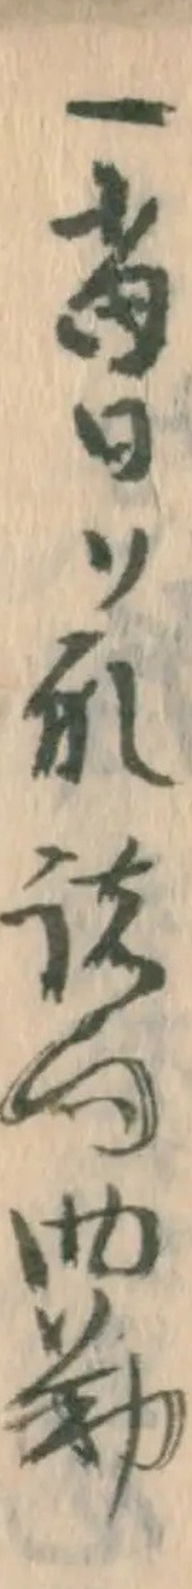一当日御礼諸向回勤
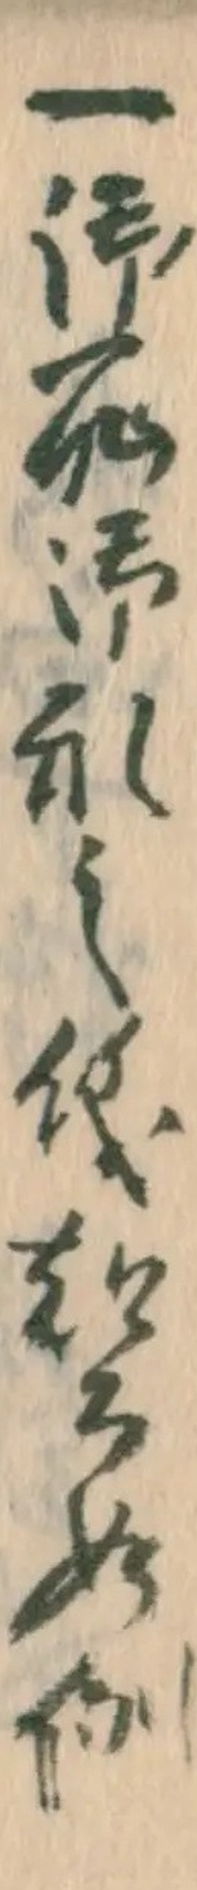一御所御礼之儀都而如例
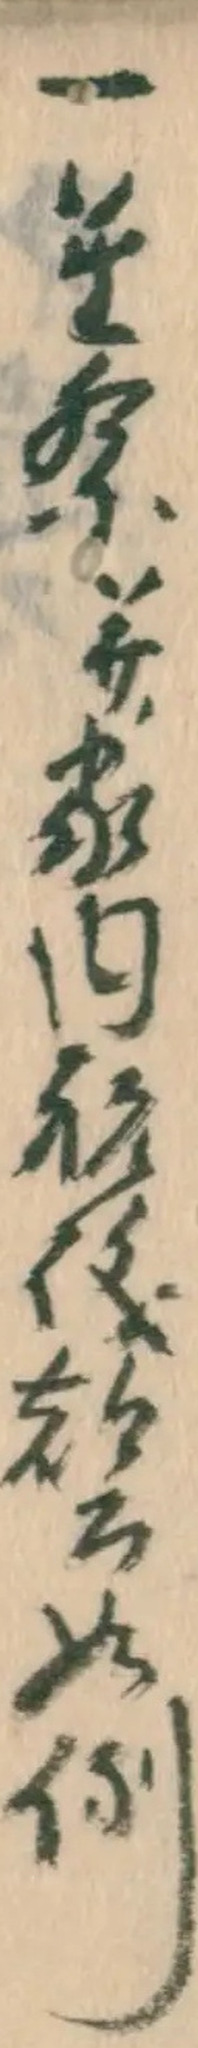一星祭并家内祝儀都而如例
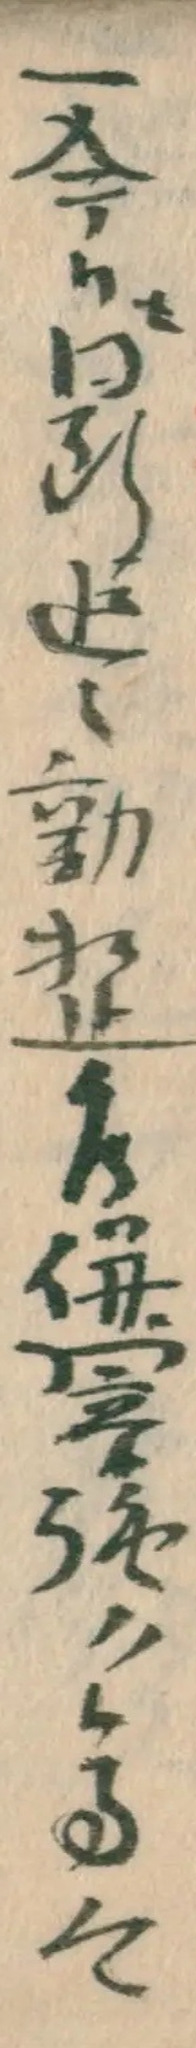一今日も同断追々動相止乍併響強ク候事今
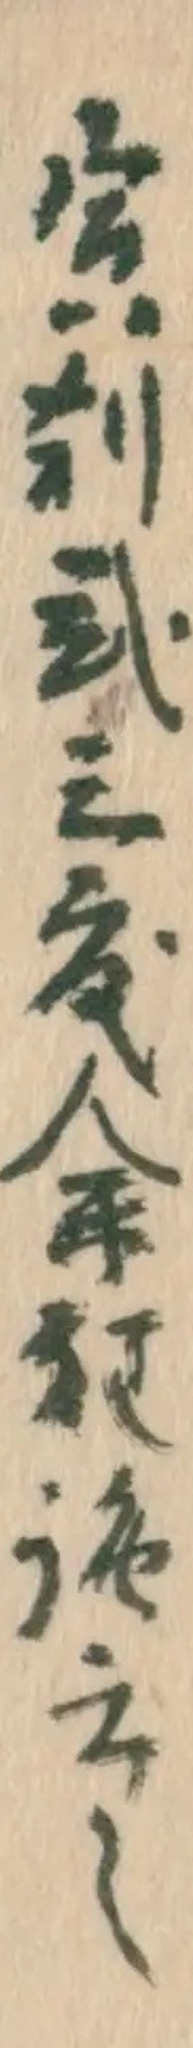寅刻弐三度余程強云々
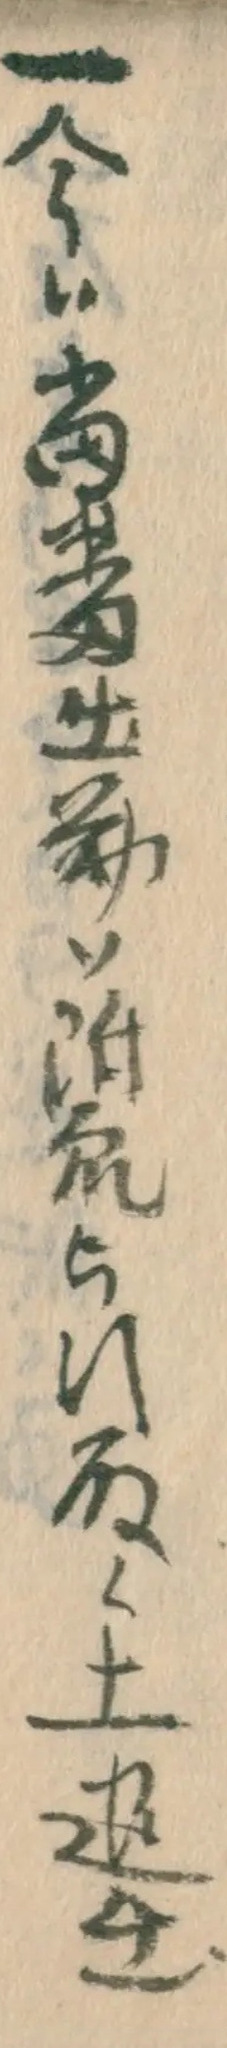一今日当番出勤御附衆被引取候上退出
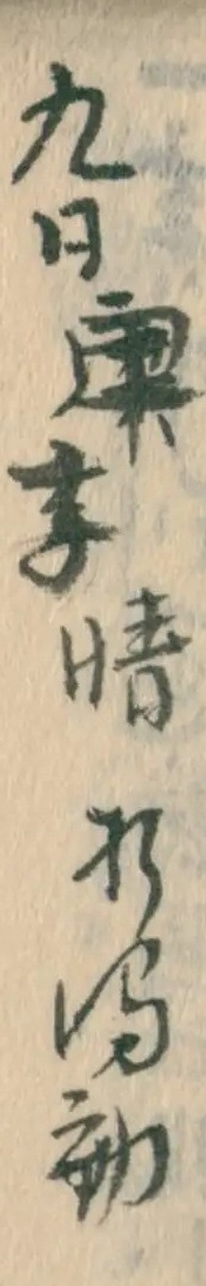九日庚子晴折鳴動

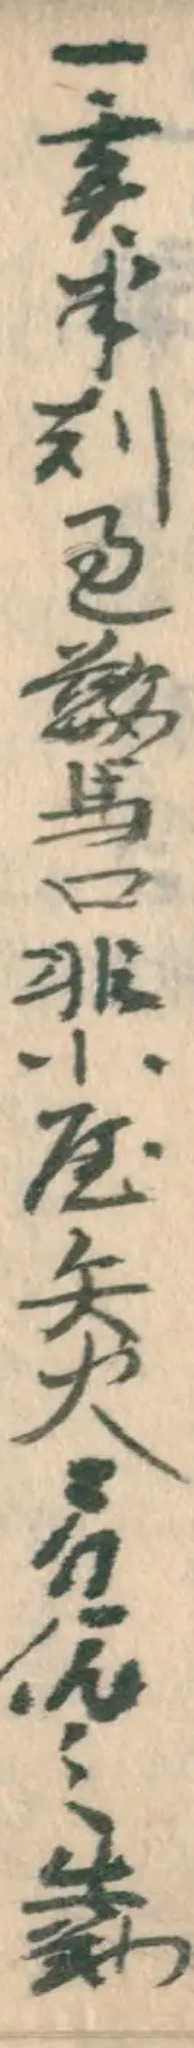一亥半刻過鞍馬口非小屋失火ニ付依之出勤
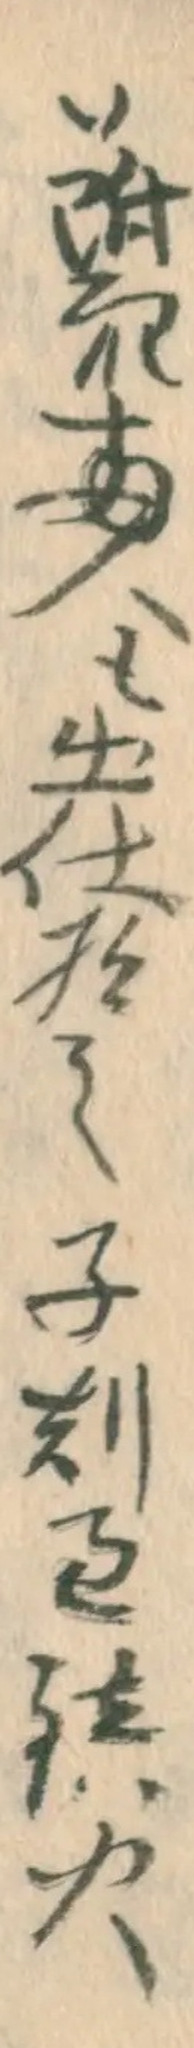御附衆両人も出仕有之子刻過鎮火
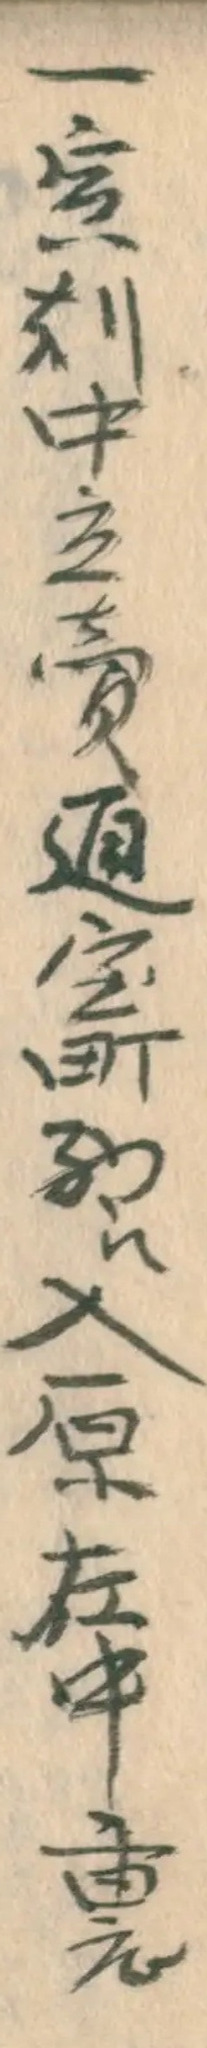一寅刻中立売通室町西え入原在中裏
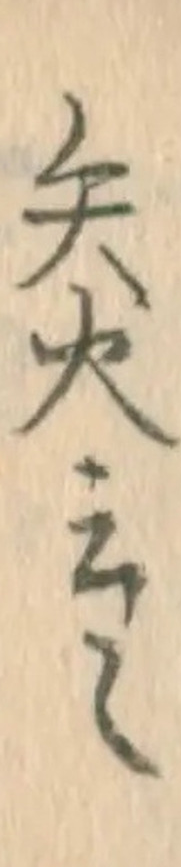失火云々
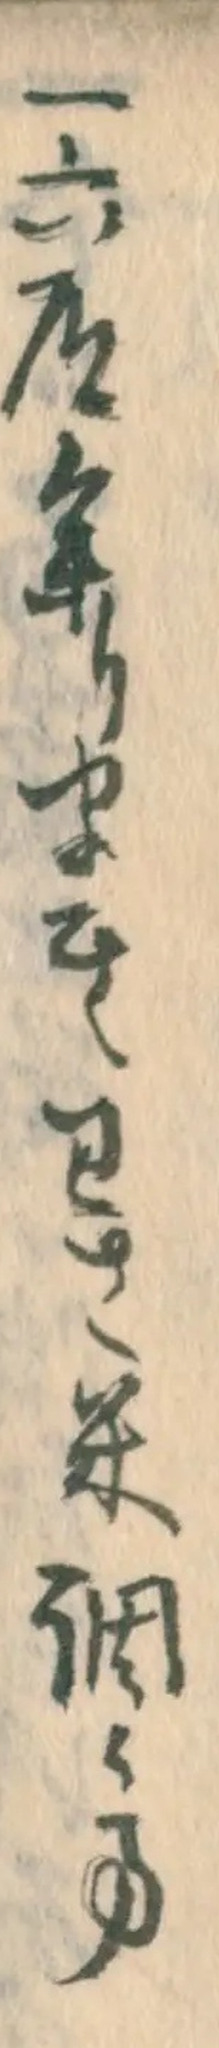一六道参りまきわさ米調候事
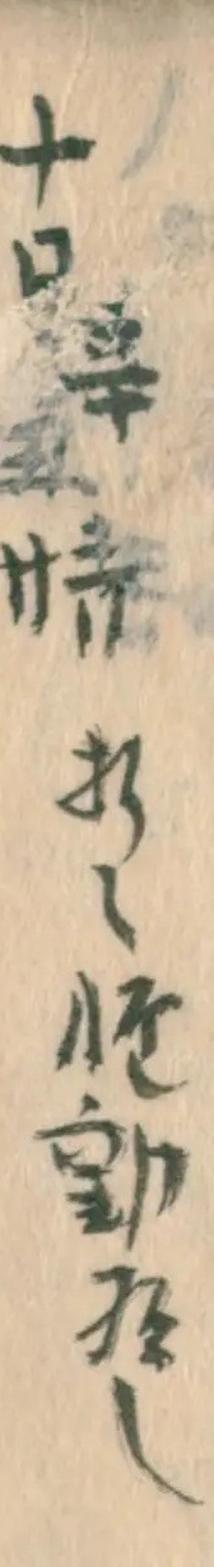十日辛丑晴折々軽動有之
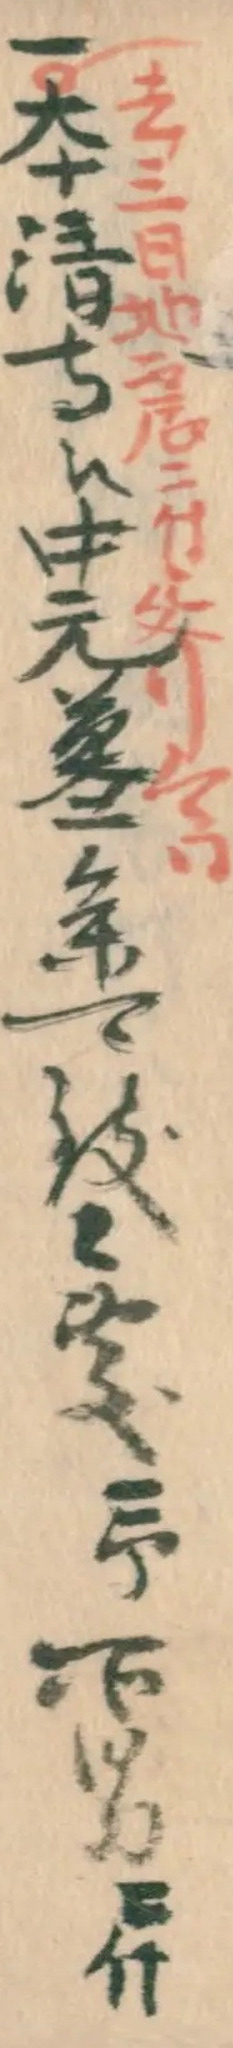一○本清寺え中元墓参可致候処予所労ニ付
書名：禁裏御所御用日記. [131]
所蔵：国立国会図書館 National Diet Library, JAPAN
